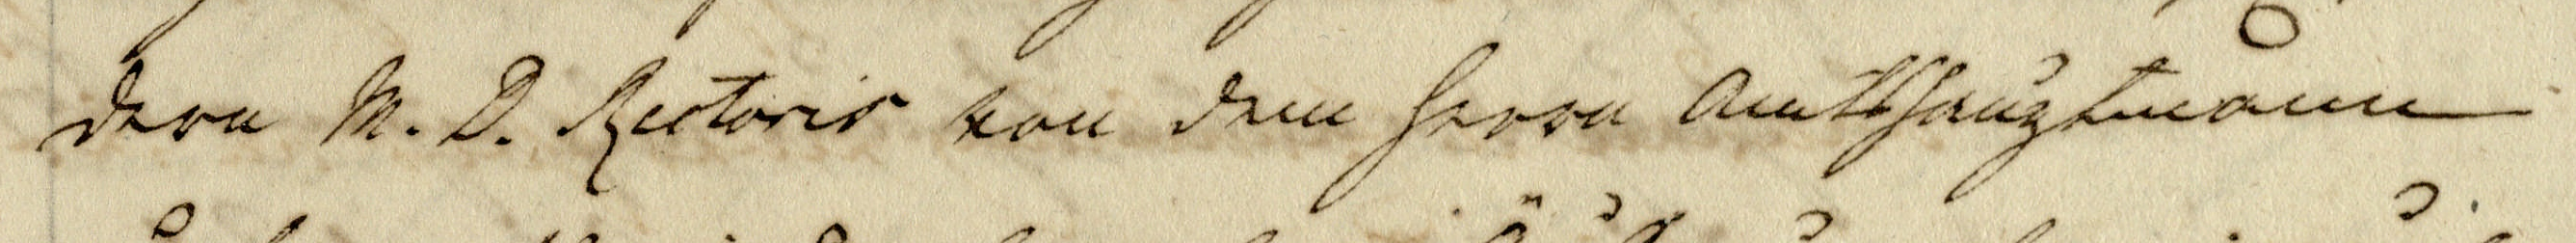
dern M. D. Rectoris von dem Herrn Amtshauptmann
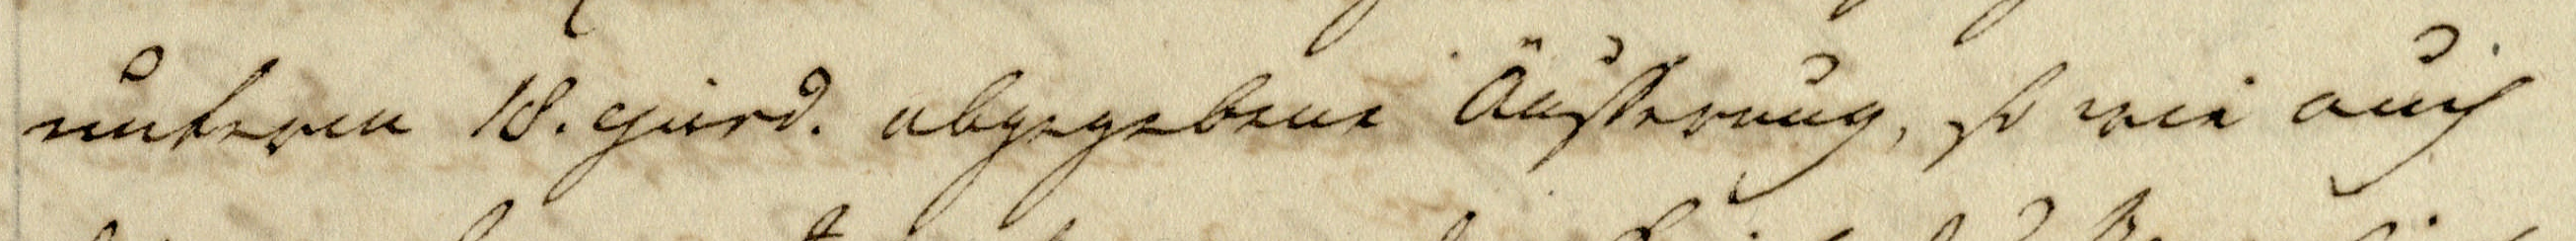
unterm 18. ejusd. abgegebene Äusserung, so wie auch
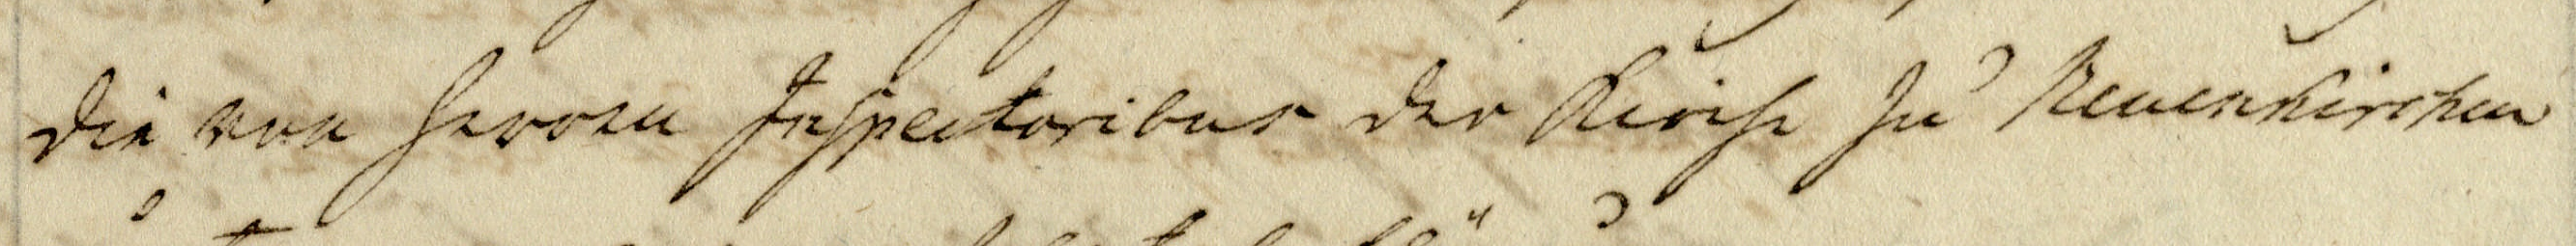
die von Herren Inspectoribus der Kirche zu Neuenkirchen
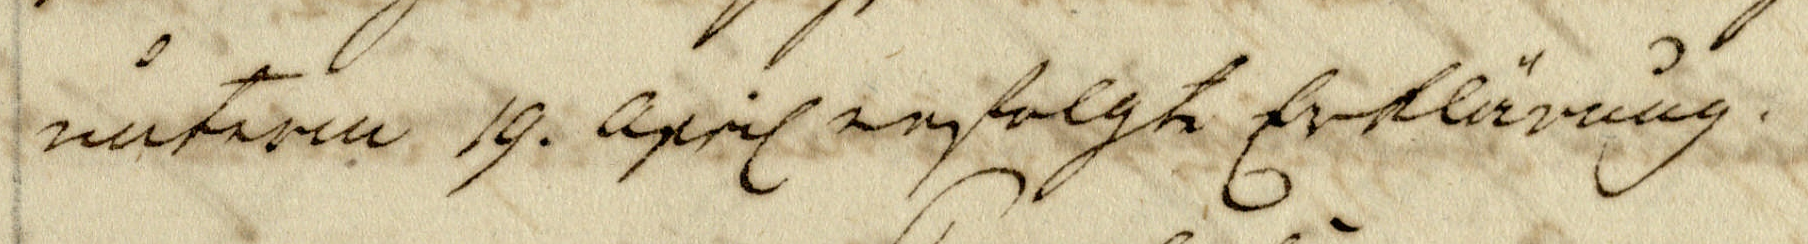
unterm 19. April erfolgte Erklärung.
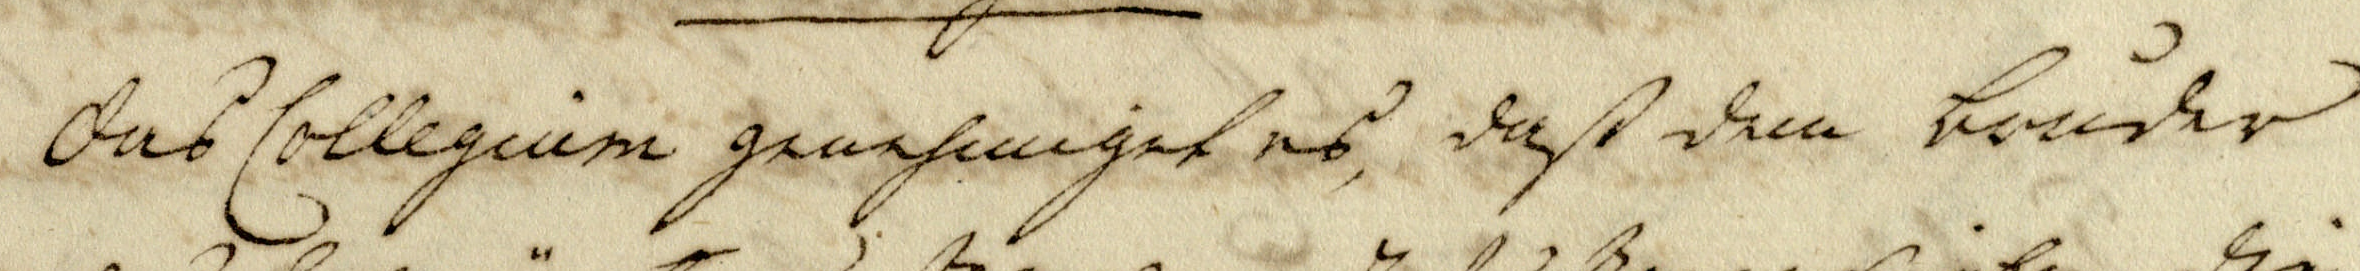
Das Collegium genehmiget es, daß dem Bruder
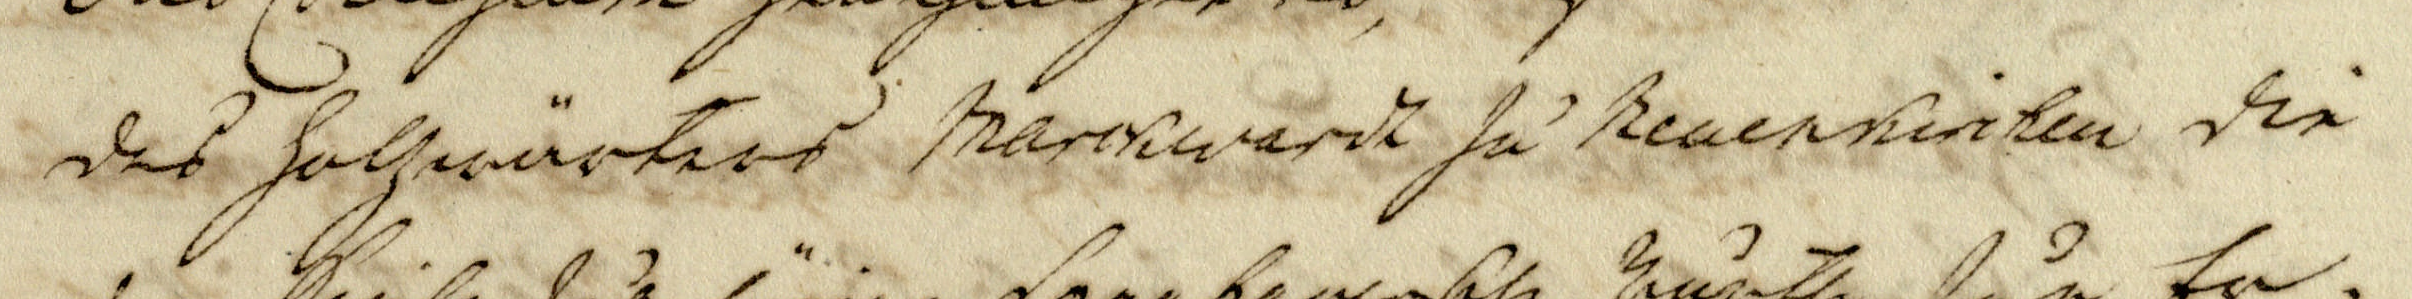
des Holzwärters Marckwardt zu Neuenkirchen die
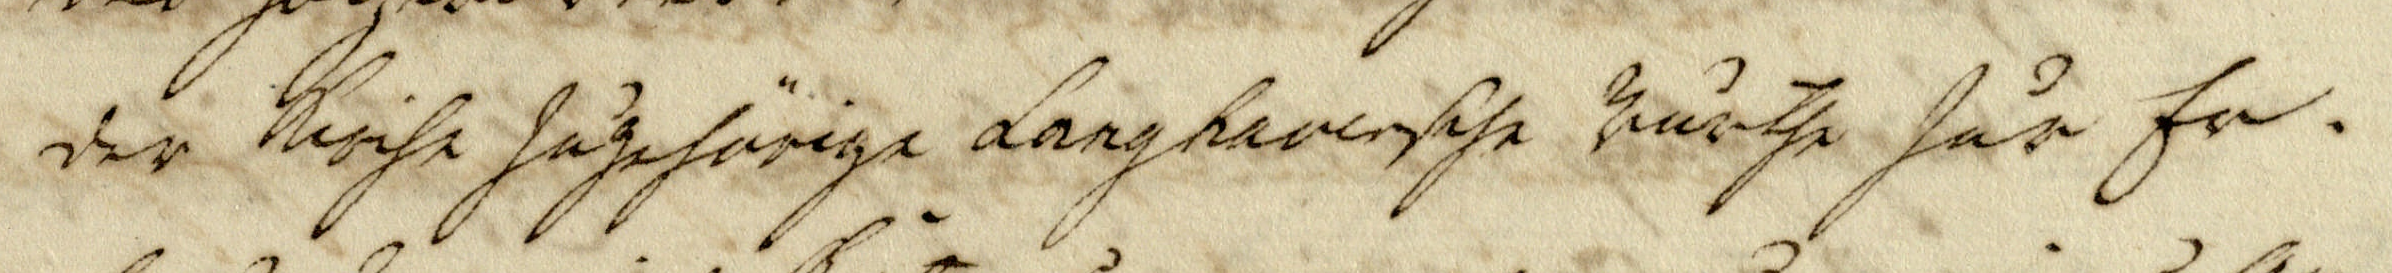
der Kirche zugehörige Langhaversche Wurthe zur Er¬
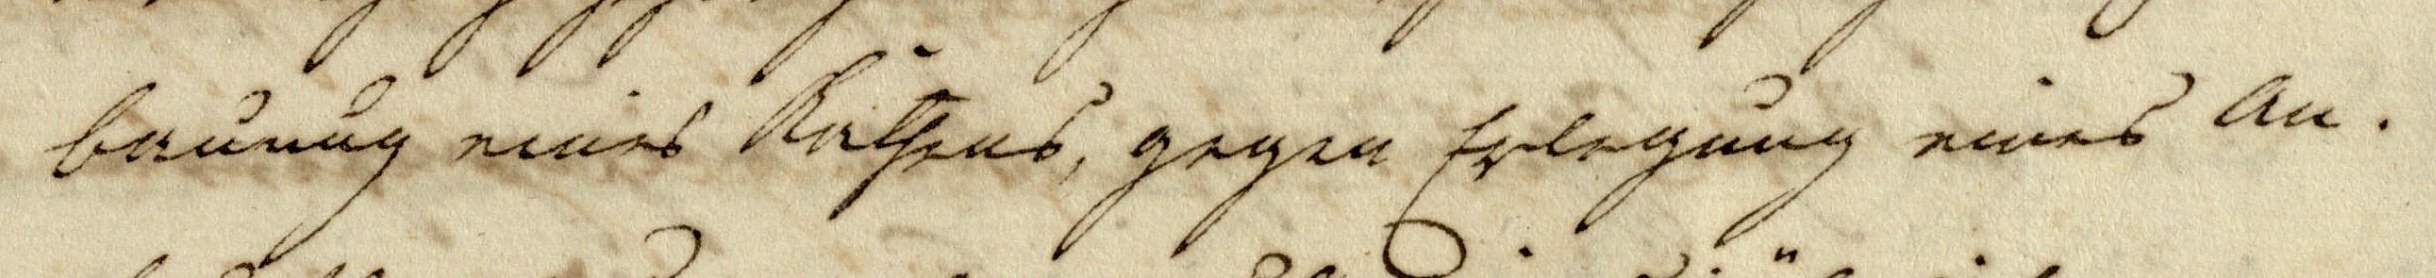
bauung eines Kathens, gegen Erlegung eines An¬
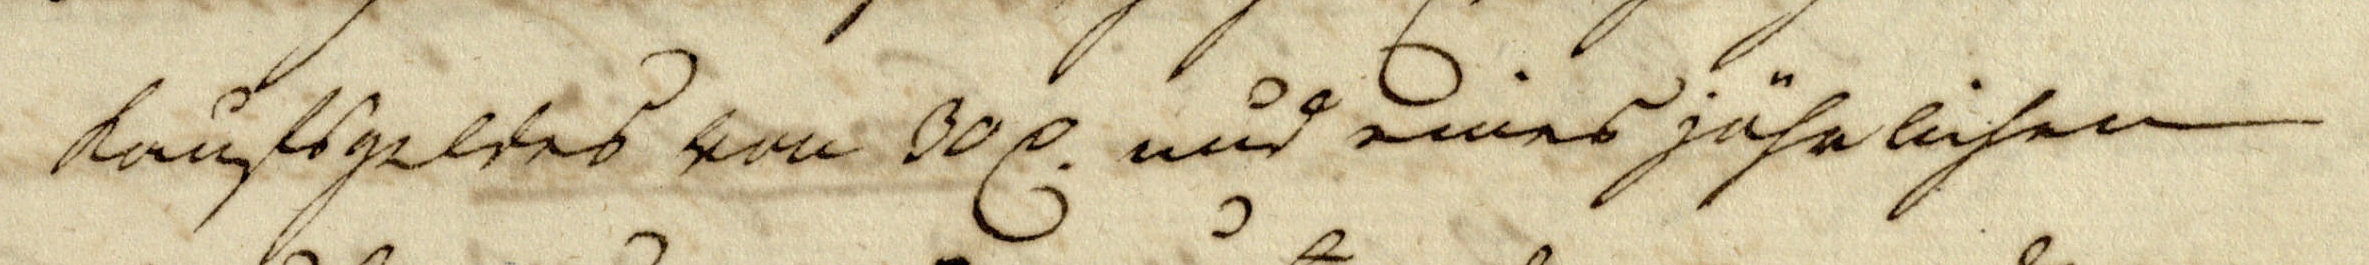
kaufsgeldes von 30 l. und eines jährlichen
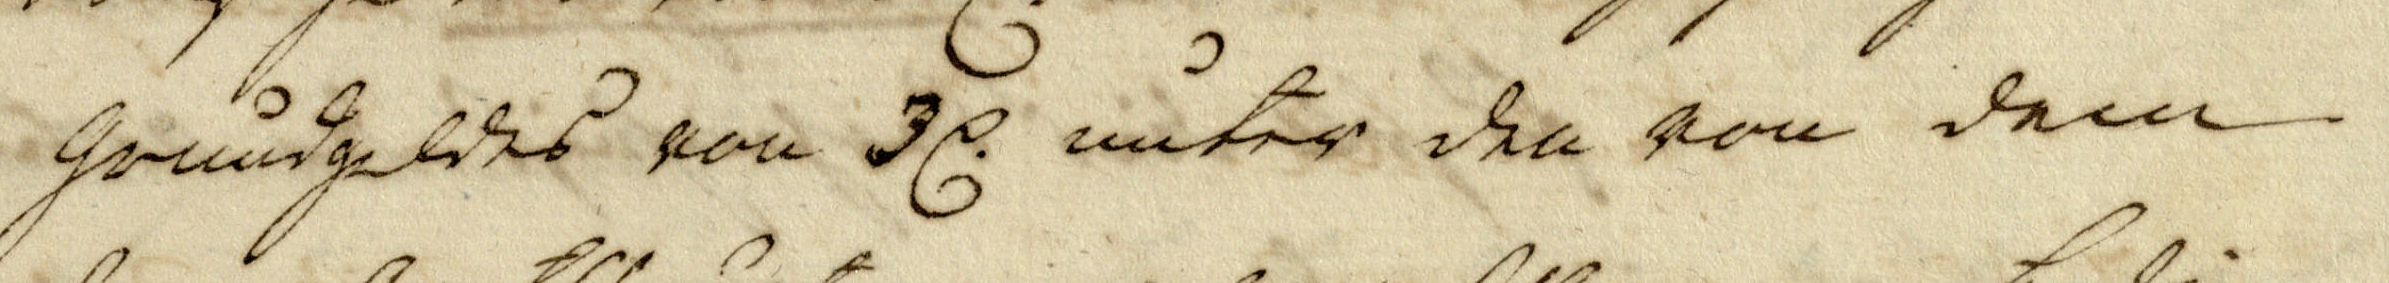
Grundgeldes von 3 l. unter den von dem
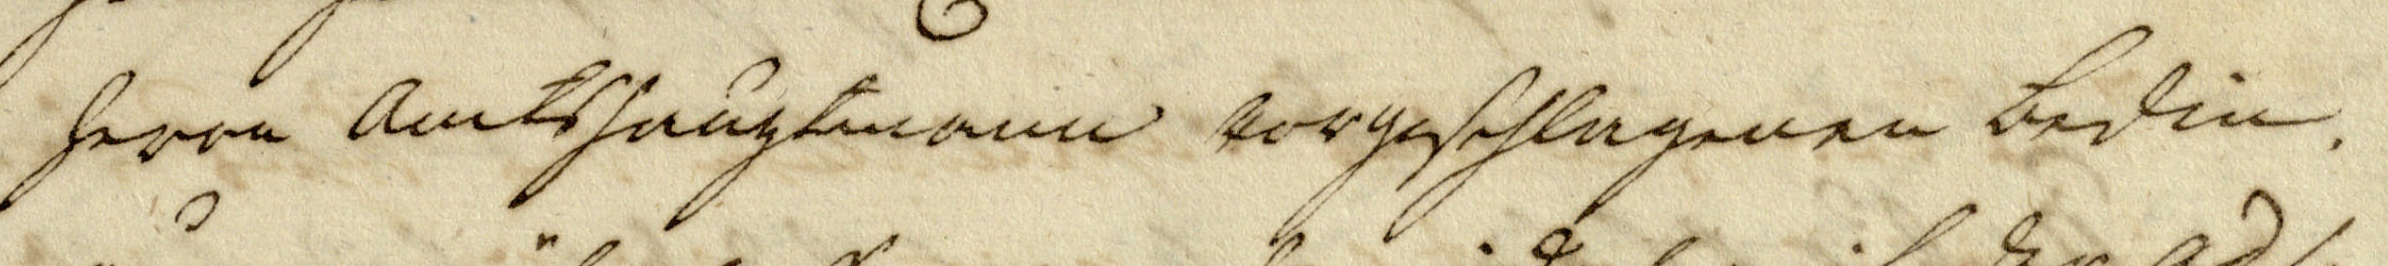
Herrn Amtshauptmann vorgeschlagenen Bedin¬
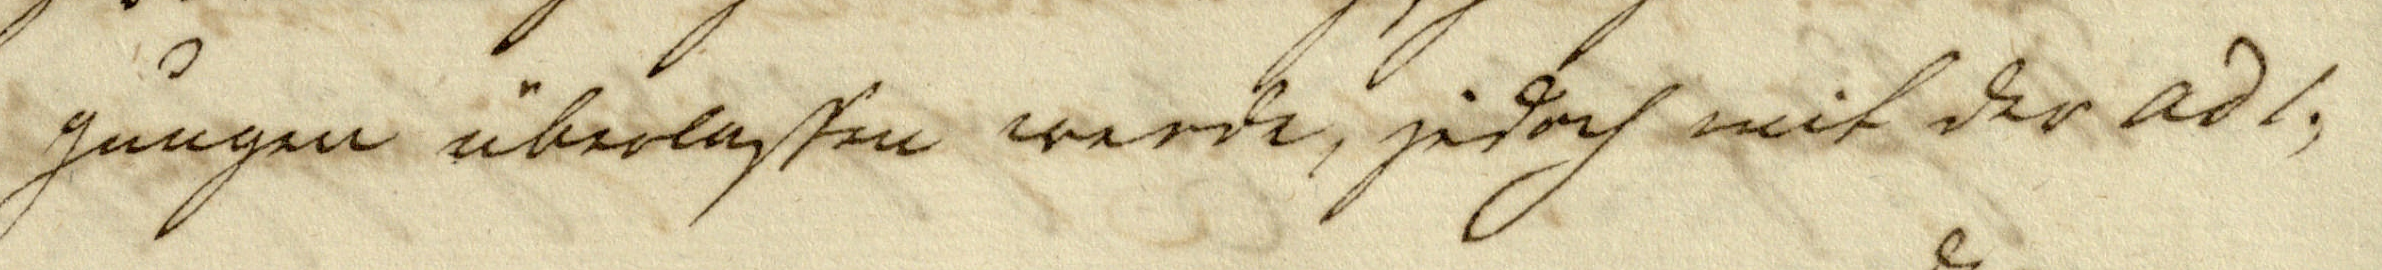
gungen überlassen werde, jedoch mit der ad 1.,
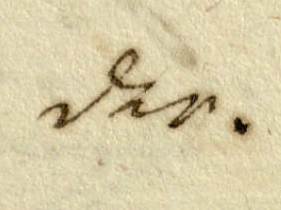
der¬
